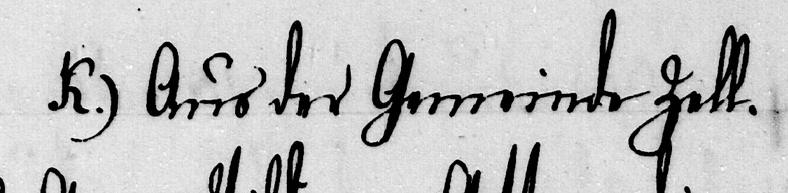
k.) Aus der Gemeinde Zell.
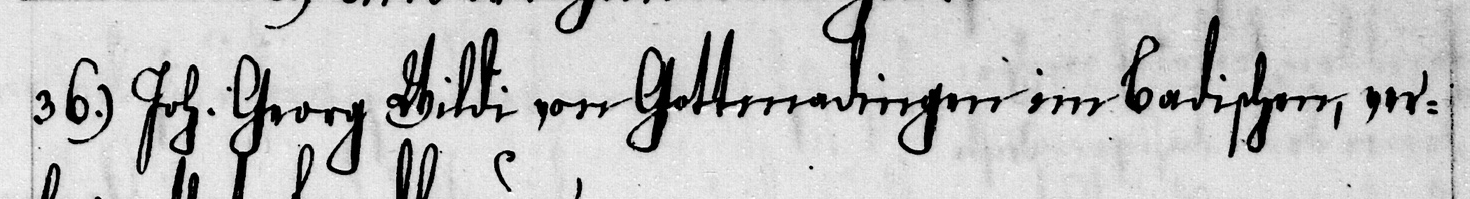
36.) Joh. Georg Wildi von Gottmadingen im Badischen, ver¬
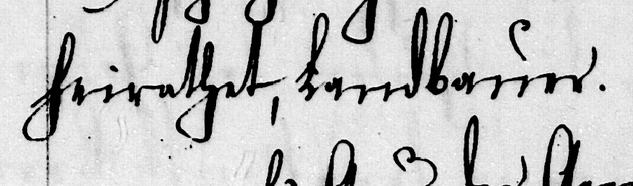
heirathet, Landbauer.
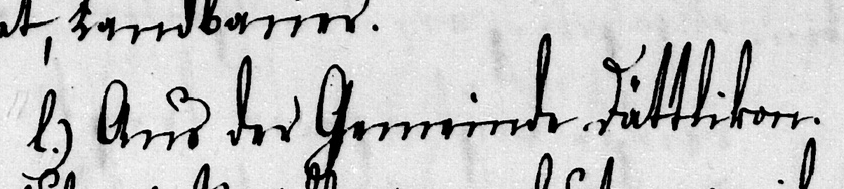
l.) Aus der Gemeinde Dättlikon.
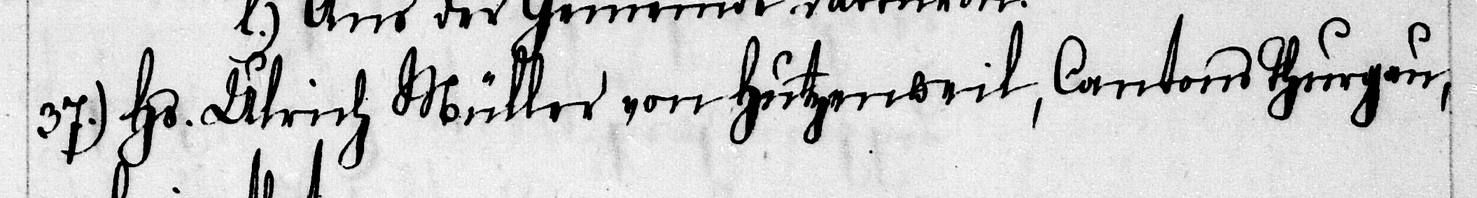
37.) Hs. Ulrich Müller von Hutzenweil, Cantons Thurgau,
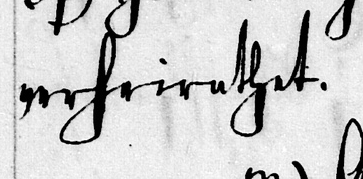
verheirathet.
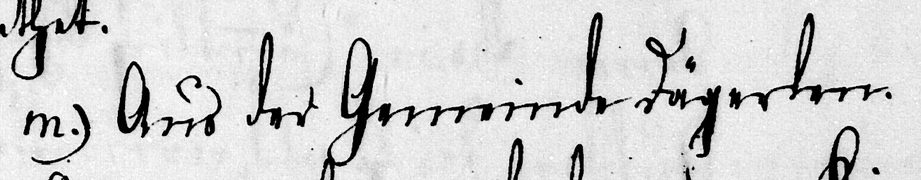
m.) Aus der Gemeinde Dägerlen.
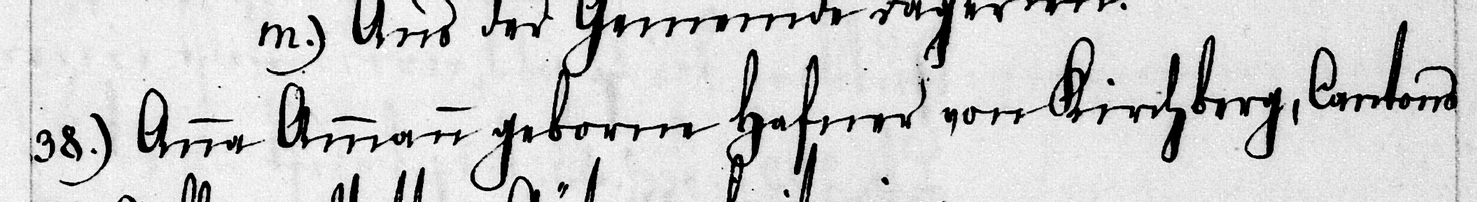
38.) Anna Ammann geborne Hafner von Kirchberg, Cantons
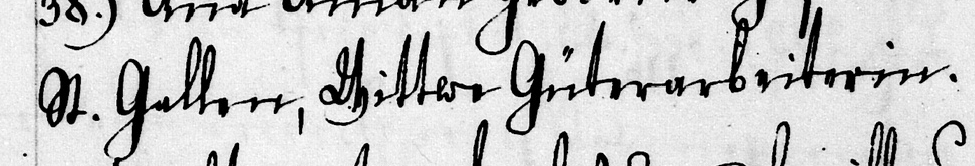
St. Gallen, Wittwe Güterarbeiterin.
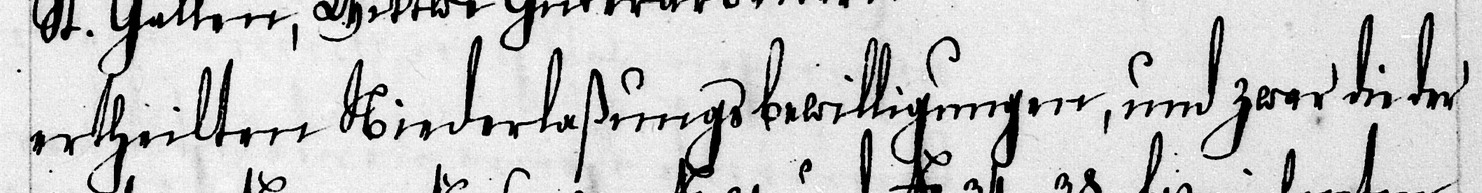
ertheilten Niederlaßungsbewilligungen, und zwar die der
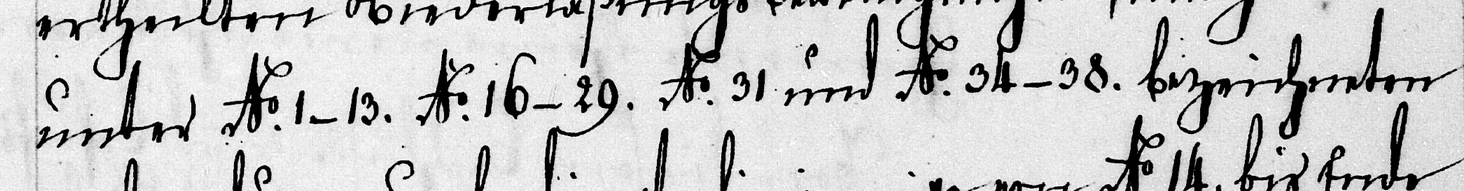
unter No. 1–13. No.16–29. No. 31 und No. 34–38. bezeichneten
